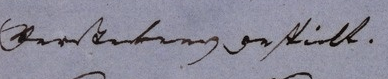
Versteckens gespielt.
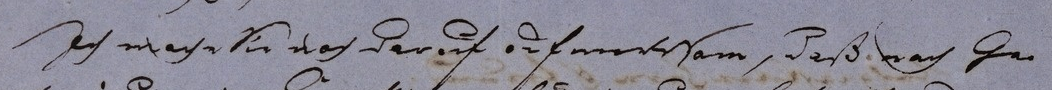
Ich mache Sie noch darauf aufmerksam, daß nach Ge-
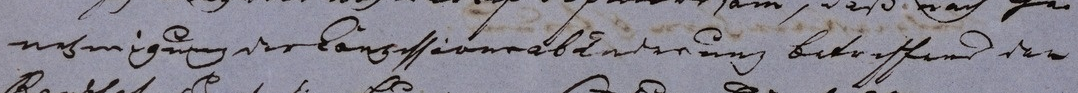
nehmigung der Conzessionsabänderung betreffend den
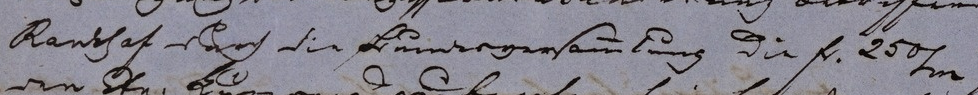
Rankhof durch die Bundesversammlung die Fr. 250/m
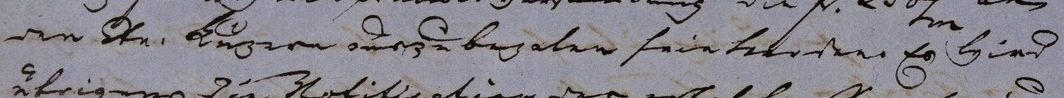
den Ctn. Luzern auszubezalen sein werden. Es wird
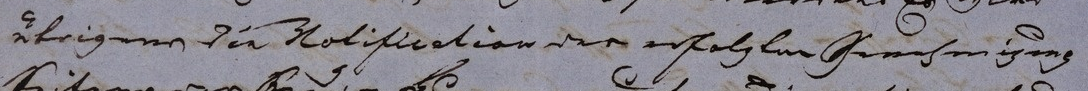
übrigens die Notification der erfolgten Genehmigung
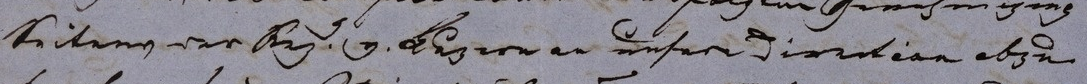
Seitens der Regg v. Luzern an unsere Direction abzu-
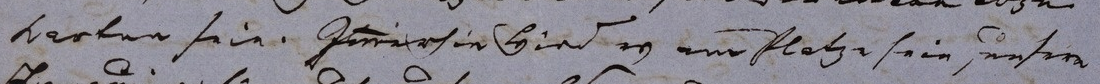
warten sein. Immerhin wird es am Platze sein, unsern
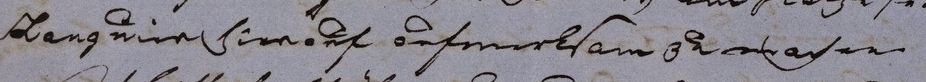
Banquier hierauf aufmerksam zu machen.
